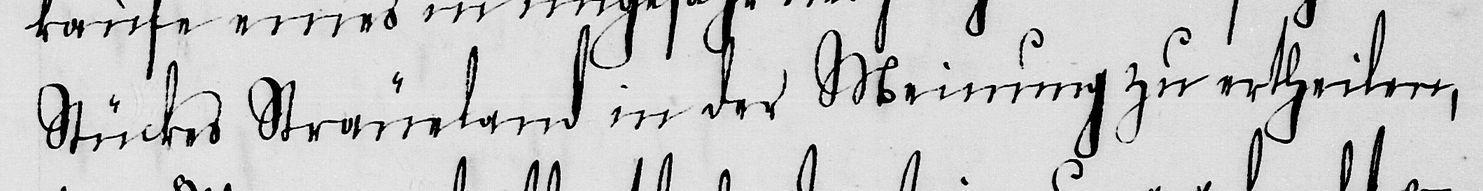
Stückes Sträueland in der Meinung zu ertheilen,
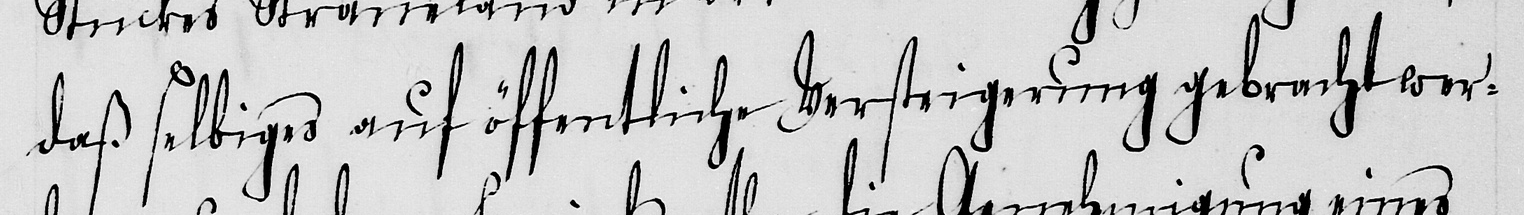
daß selbiges auf öffentliche Versteigerung gebracht wer¬
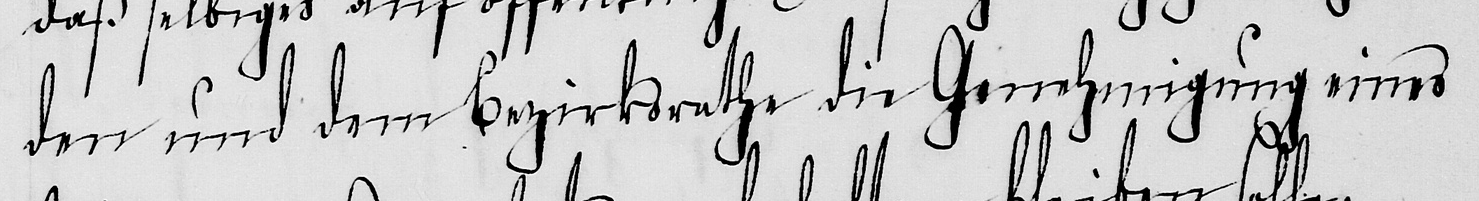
de und dem Bezirksrathe die Genehmigung eines
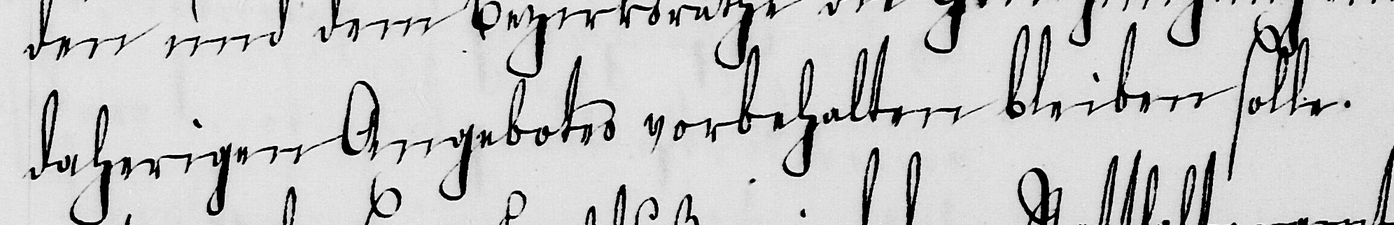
daherigen Angebotes vorbehalten bleiben solle.
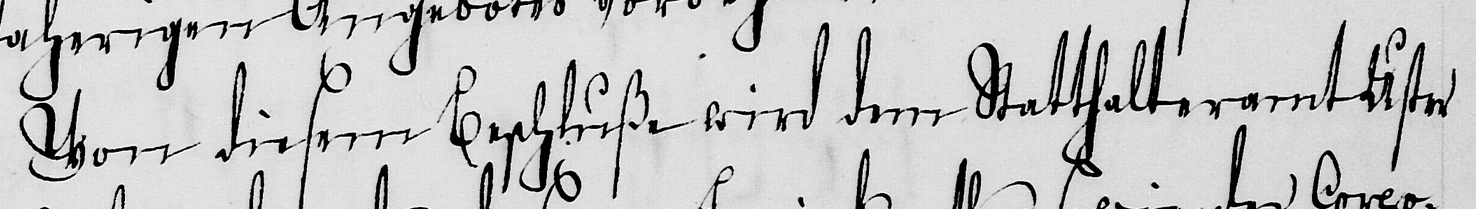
Von diesem Beschluß wird dem Statthalteramt Uster
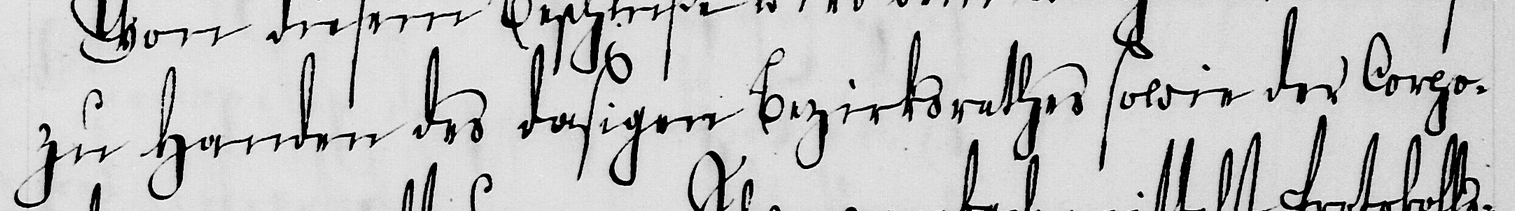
zu Handen des dasigen Bezirksrathes sowie der Corpo¬
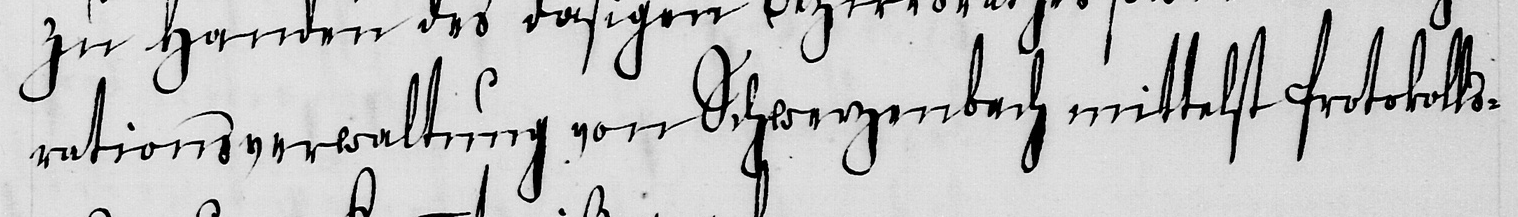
rationsverwaltung von Schwerzenbach mittelst Protokoll¬
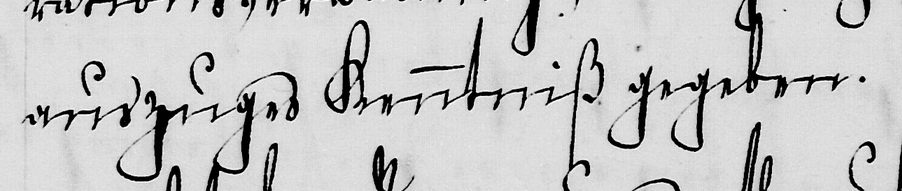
sauszuges Kenntniß gegeben.
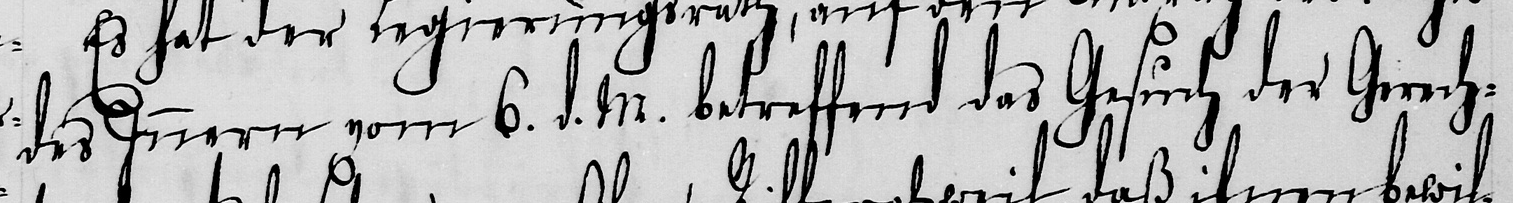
des Innern vom 6. d. M. betreffend das Gesuch der Gerec¬
